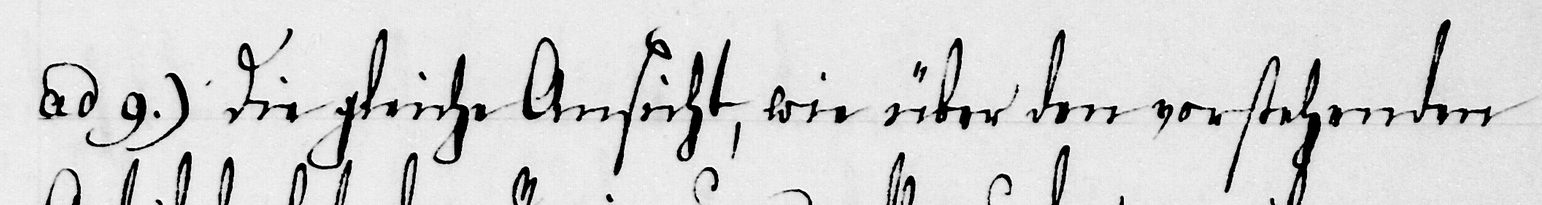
ad 9.) Die gleiche Ansicht, wie über den vorstehenden
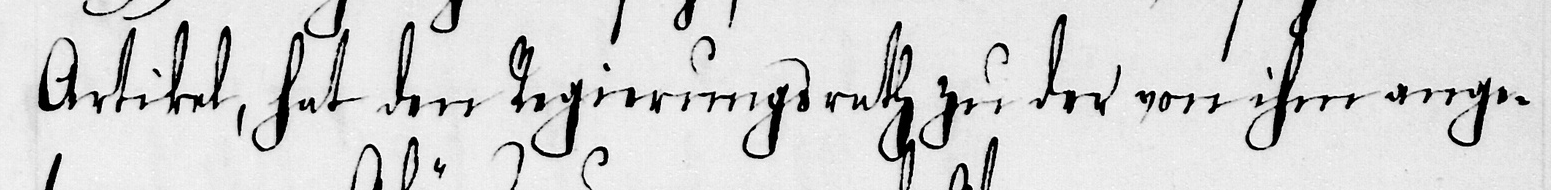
Artikel, hat den Regierungsrath zu der von ihm ange¬
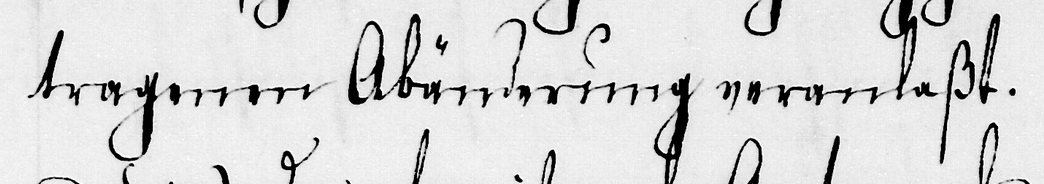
tragenen Abänderung veranlaßt.
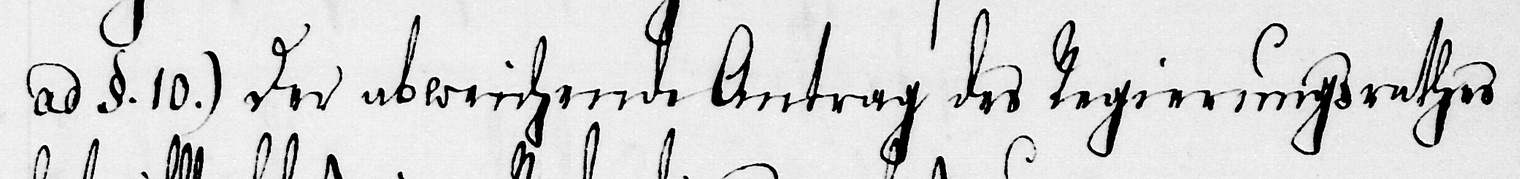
ad §. 10.) Der abweichende Antrag des Regierungsrathes
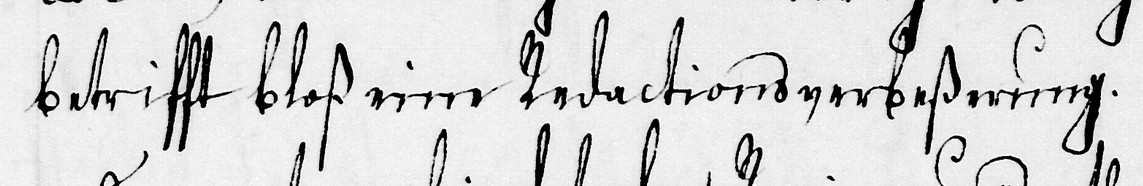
betrifft bloß eine Redactionsverbeßerung.
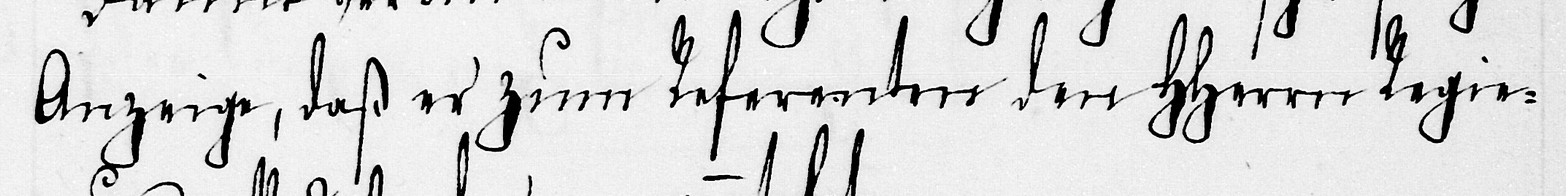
Anzeige, daß er zum Referenten den HHerrn Regie¬
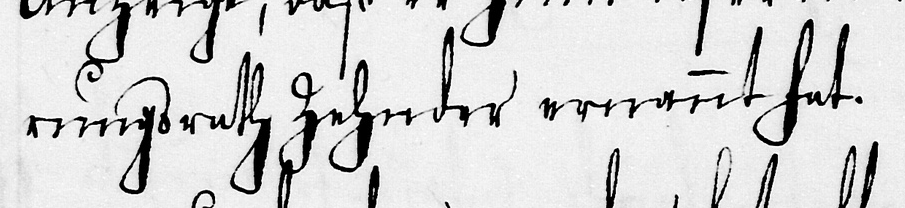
rungsrath Zehnder ernannt hat.
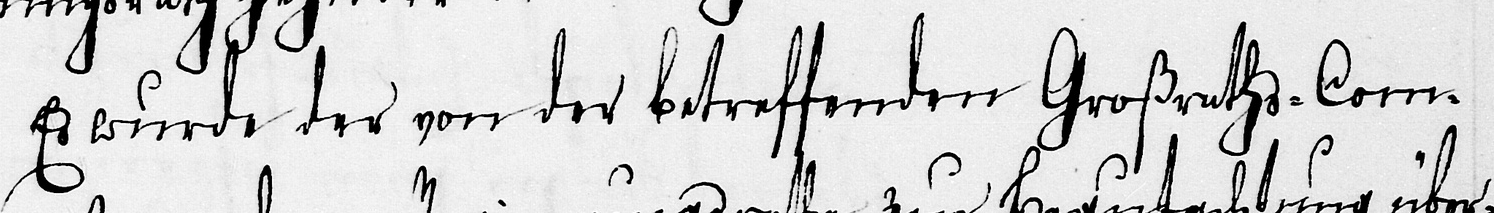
Es wurde der von der betreffenden Großraths-Com¬
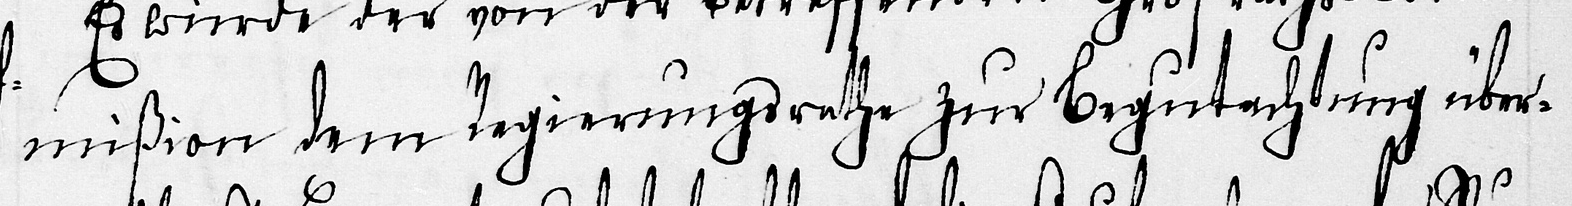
mißion dem Regierungsrathe zur Begutachtung über¬
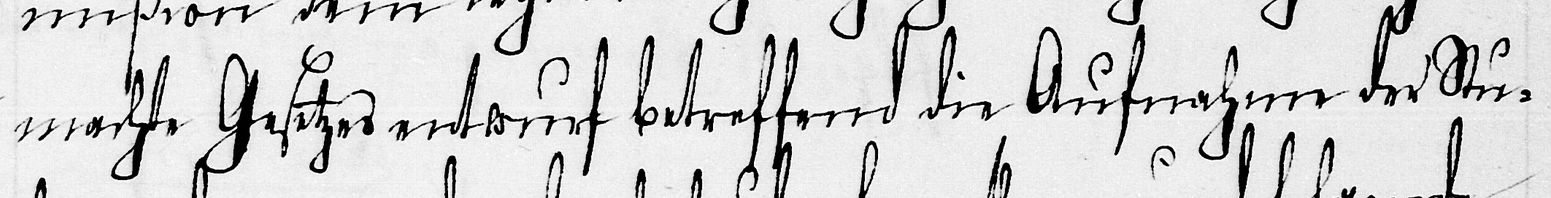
machte Gesetzesentwurf betreffend die Aufnahme der Stu¬
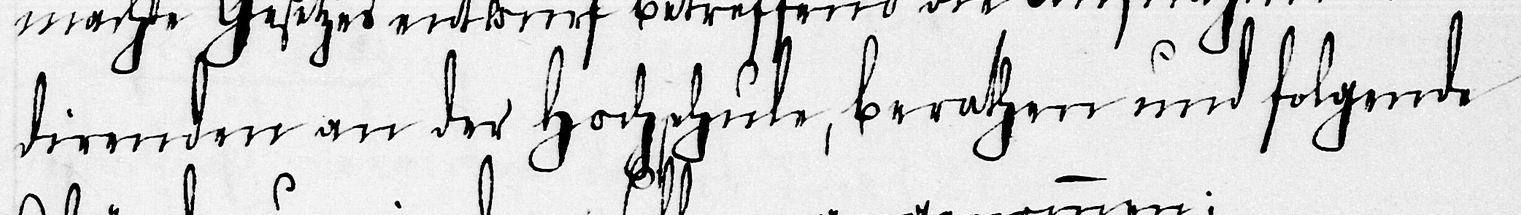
direnden an der Hochschule, berathen und folgende
